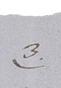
aus
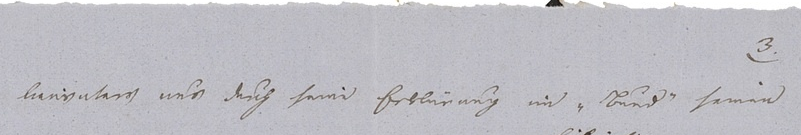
durch seine Erklärung
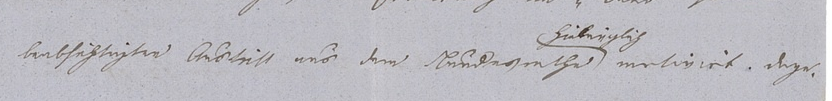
beabsichtigten Austritt aus dem Bundesrathe hinlänglich motivirt. Dage-
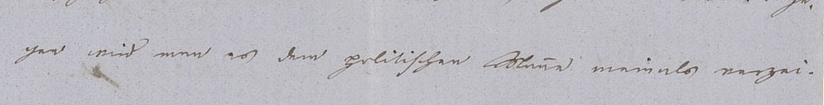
gen wird man es dem politischen Manne niemals verzei-
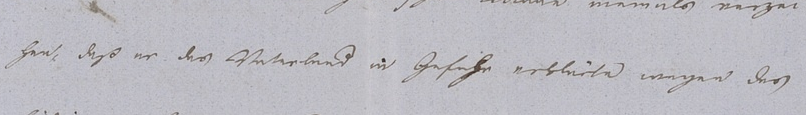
hen, daß er das Vaterland in Gefahr erklärte wegen des
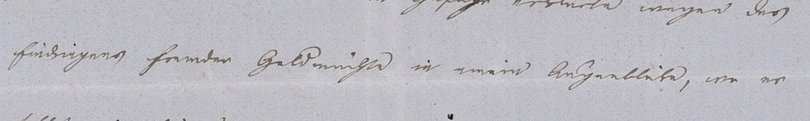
Eindringens fremder Geldmächte in einem Augenblicke, wo er
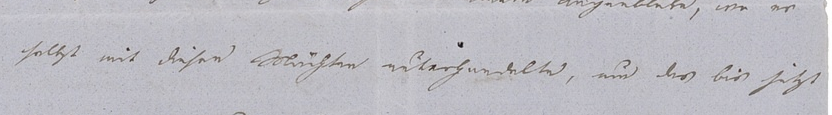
selbst mit diesen Mächten unterhandelte, um das bis jetzt
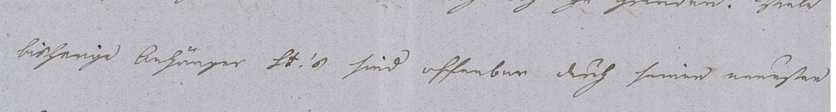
bisherige Anhänger St.'s sind offenbar durch seinen neuesten
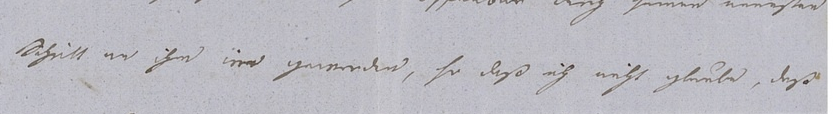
Schritt an ihm irre geworden, so daß ich nicht glaube, daß
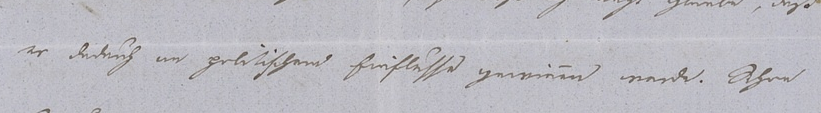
er dadurch an politischem Einflusse gewinnen werde. Schon
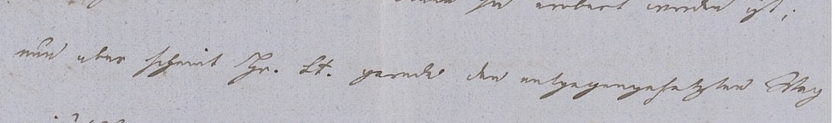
nun aber scheint Hr. St. gerade den entgegengesetzten Weg
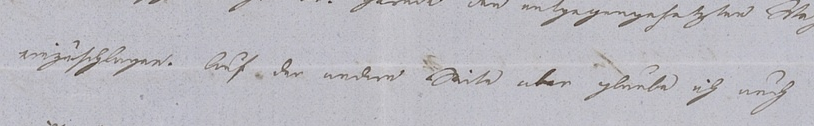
einzuschlagen. Auf der andern Seite aber glaube ich auch
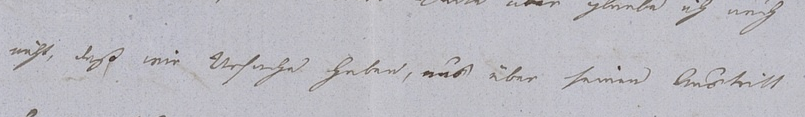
nicht, daß wir Ursache haben, uns über seinen Austritt
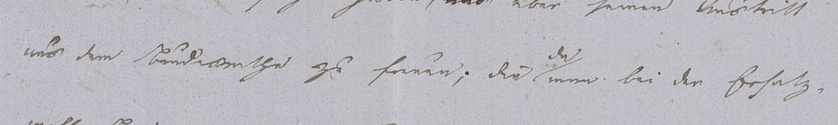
aus dem Bundesrathe zu freuen; denn da man bei der Ersatz-
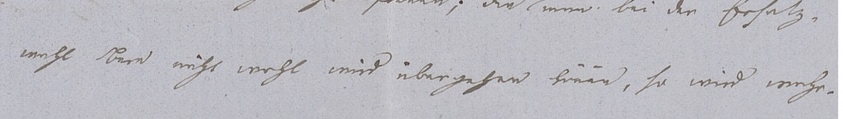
wahl Bern nicht wohl wird übergehen können, so wird wahr-
